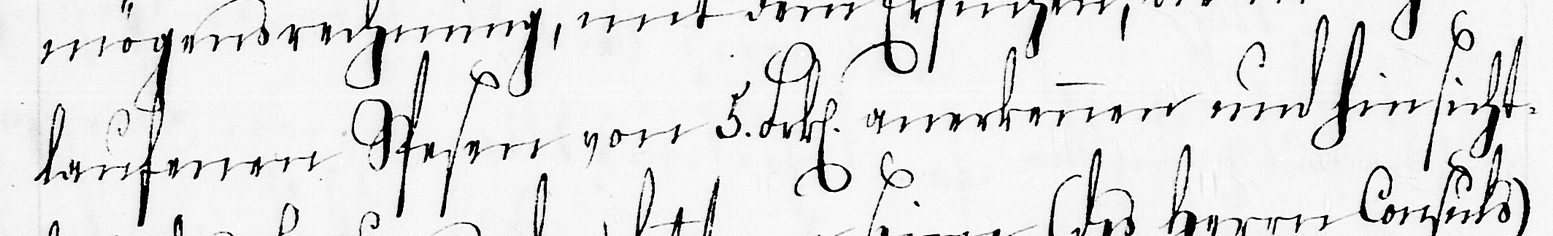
laufenen Spesen von 5. Frk[en]. anerkennen und hinsicht¬
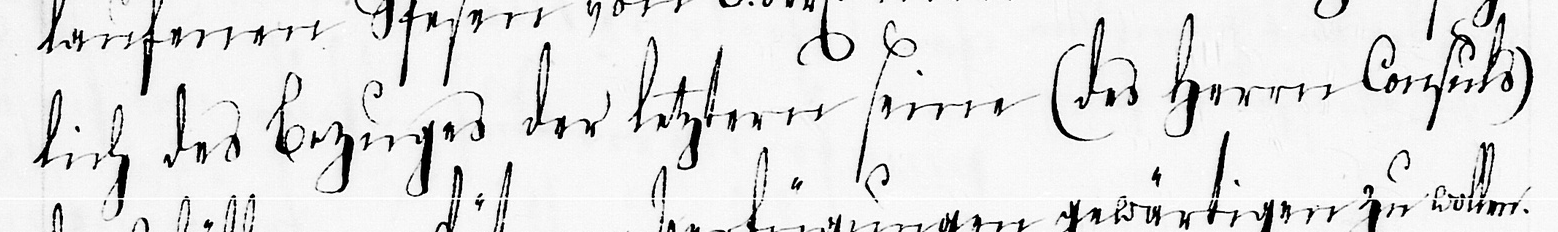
lich des Bezuges der letztern seine (des Herrn Consuls)
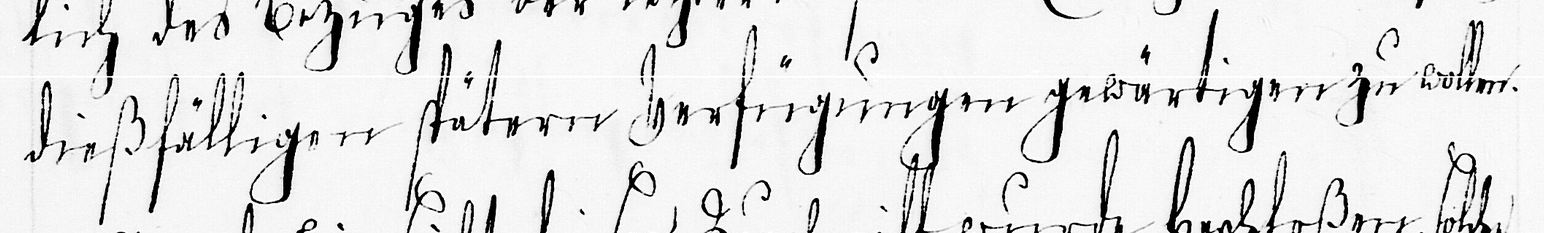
dießfälligen spätern Verfügungen gewärtigen zu wolle¬
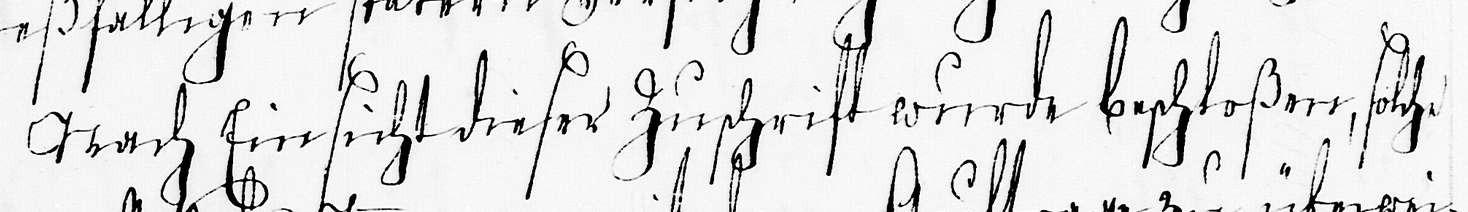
Nach Einsicht dieser Zuschrift wurde beschloßen, sol¬
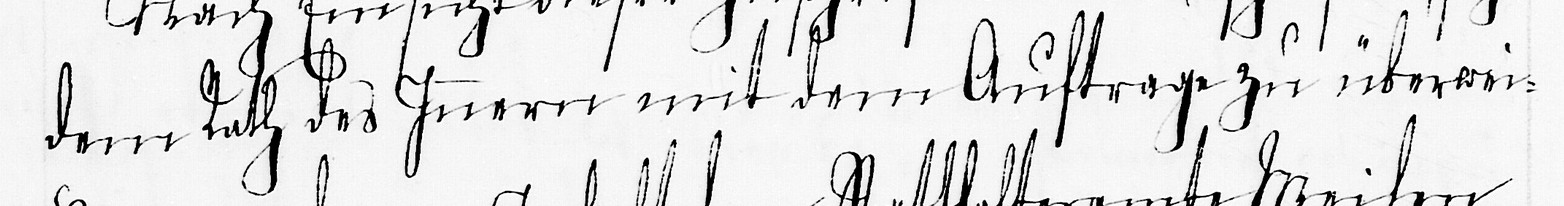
dem Rath des Innern mit dem Auftrage zu überwei¬
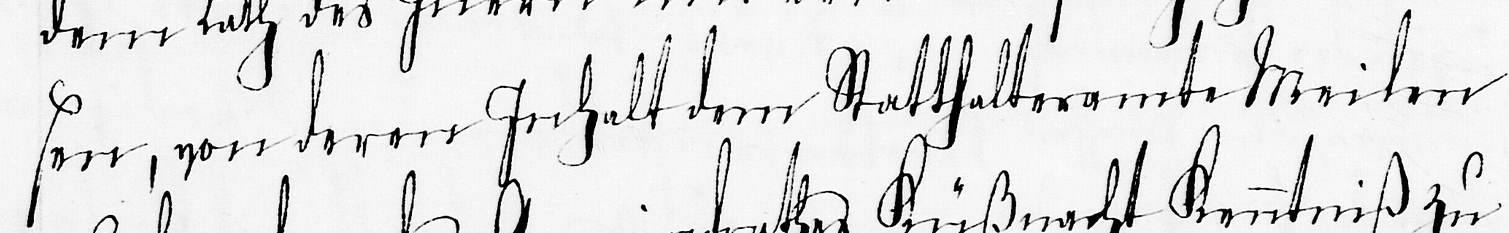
sen, von deren Inhalt dem Statthalteramte Meilen
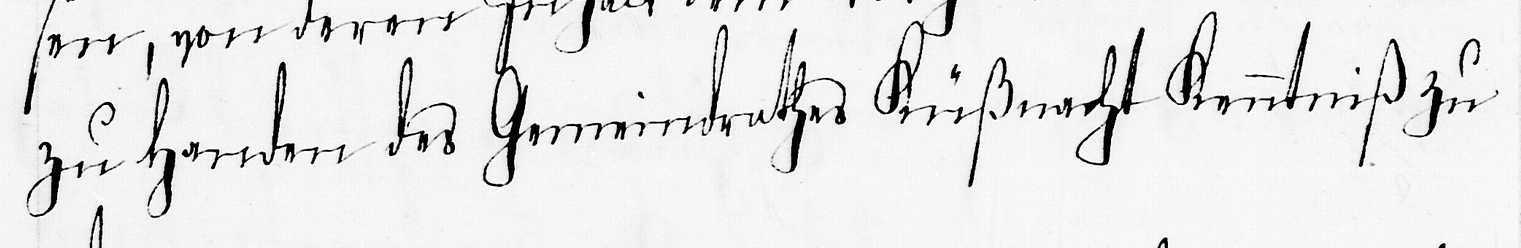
zu Handen des Gemeindrathes Küßnacht Kenntniß zu
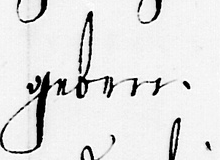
geben.
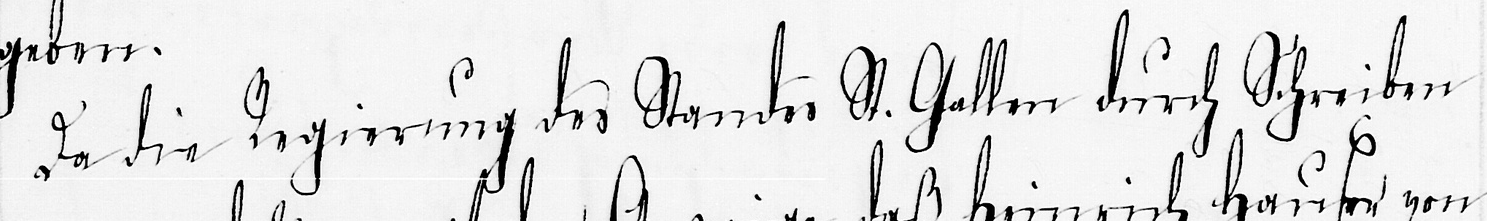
Da die Regierung des Standes St. Gallen durch Schreiben
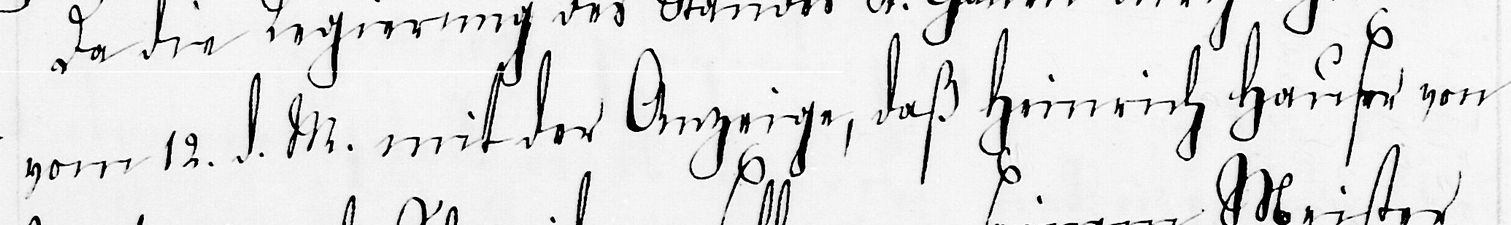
vom 12. d. M. mit der Anzeige, daß Heinrich Hauser von
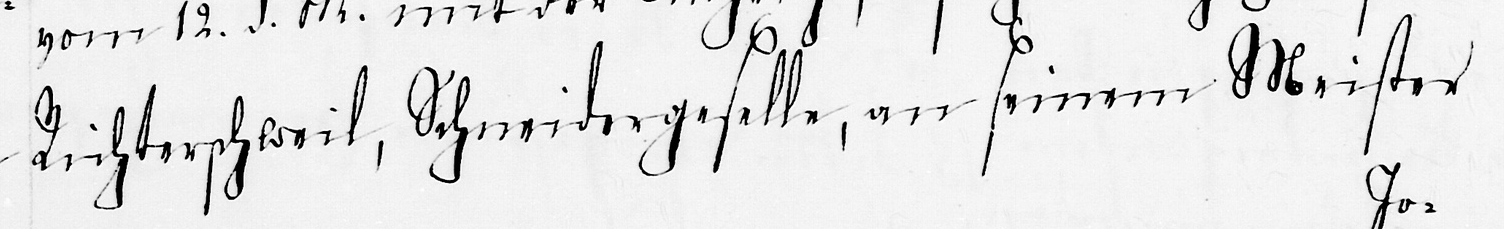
Richterschweil, Schneidergeselle, an seinem Meister
